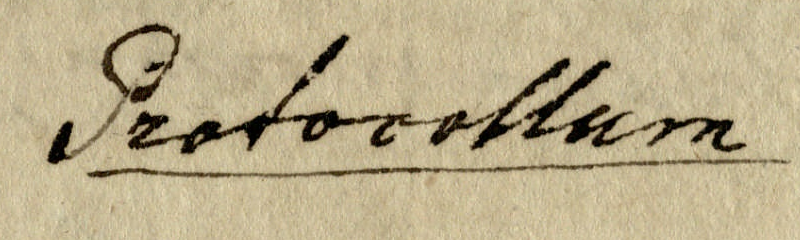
Protocollum
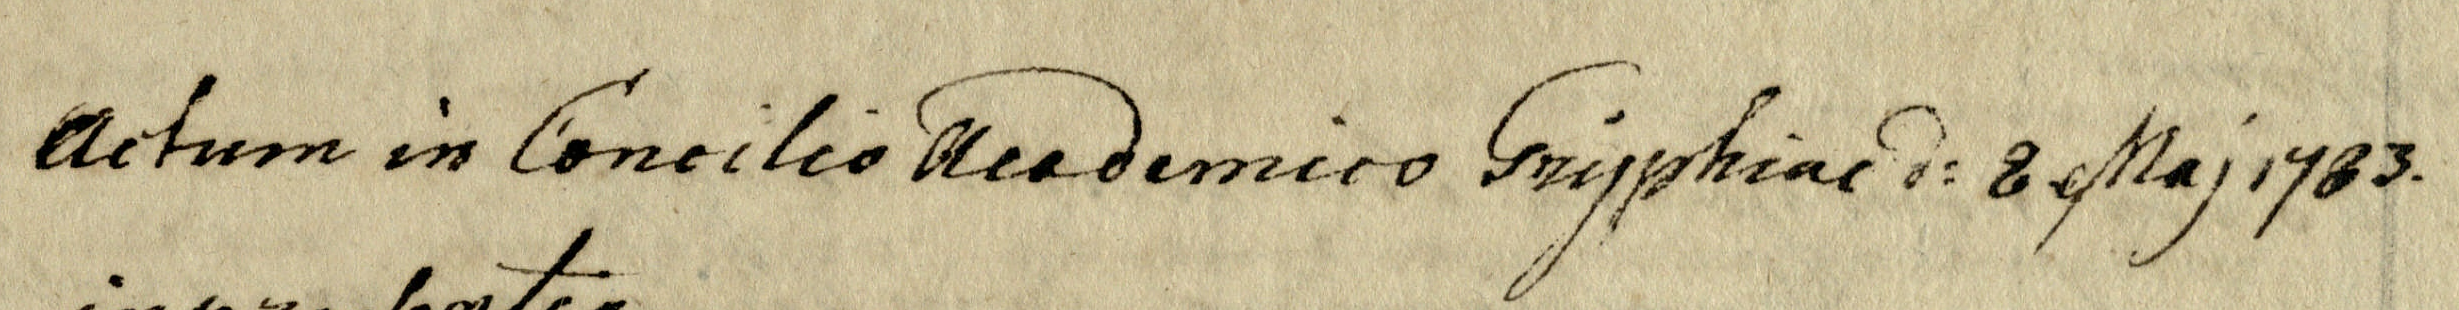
Actum in Concilio Academico Grÿphiae d. 8. Maj 1783.
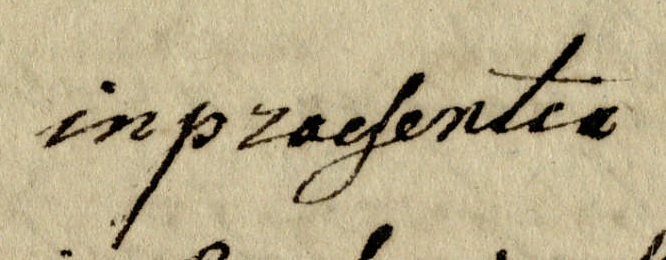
in paesentia
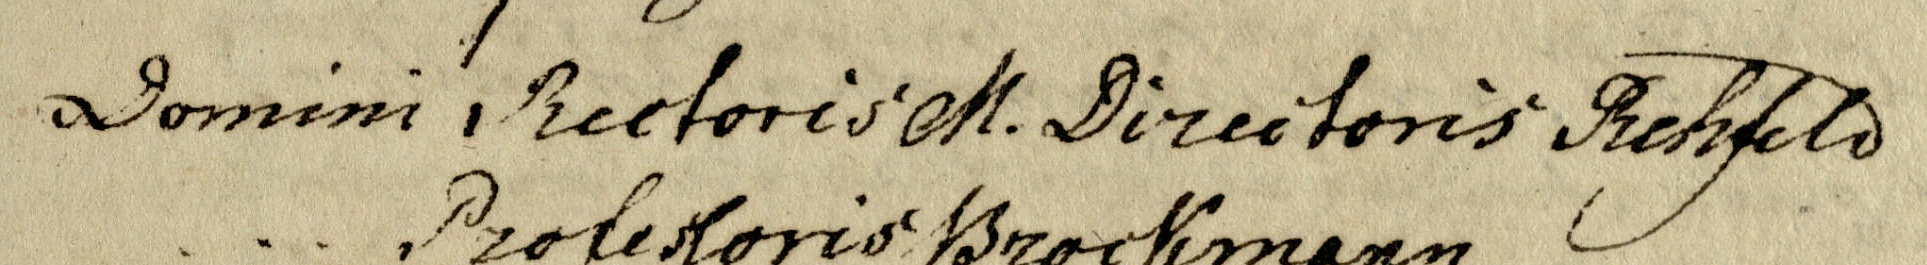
Domini Rectoris M. Directoris Rehfeld
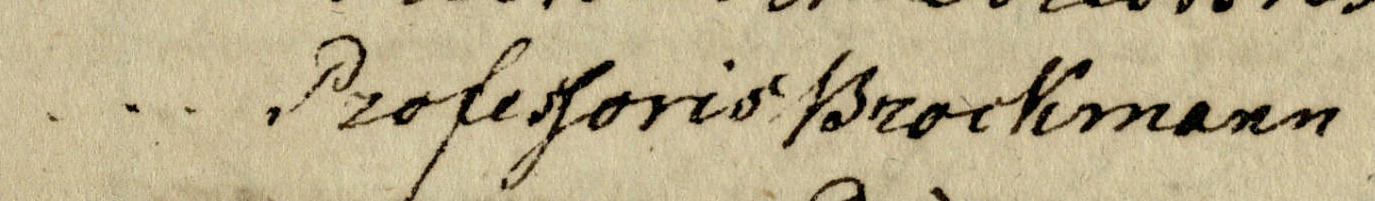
Professoris Brockmann
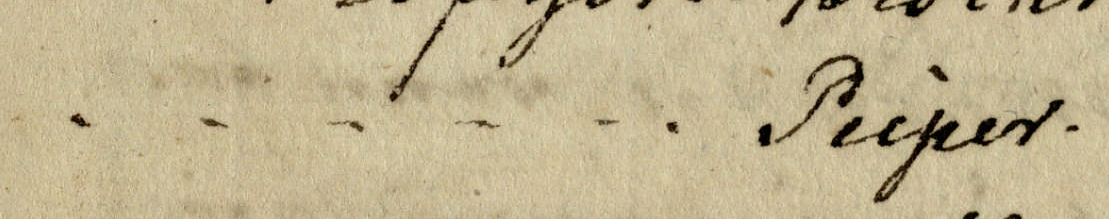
Pieper.
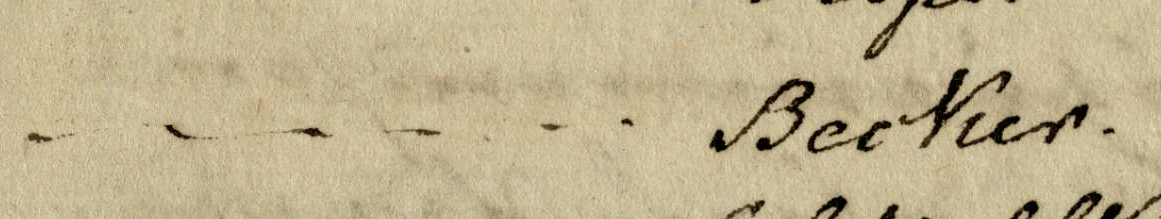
Becker.
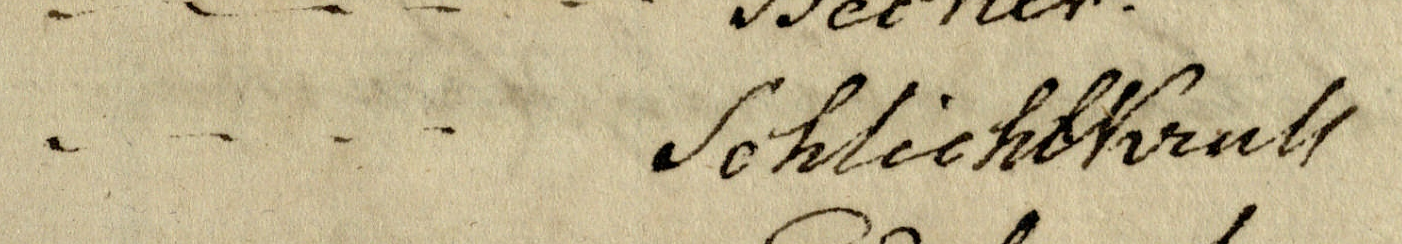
Schlichtkrull
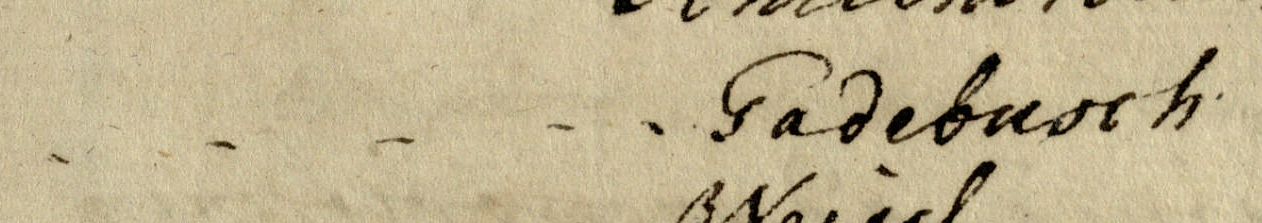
Gadebusch.
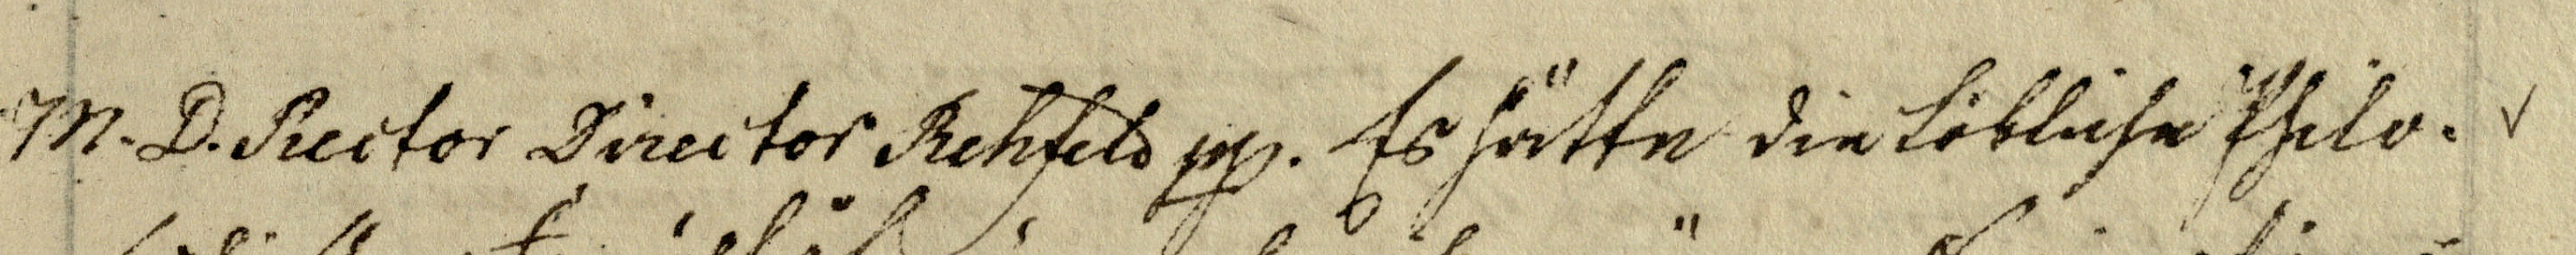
M. D. Rector Director Rehfeld pp. Es hätte die Löbliche Philo¬
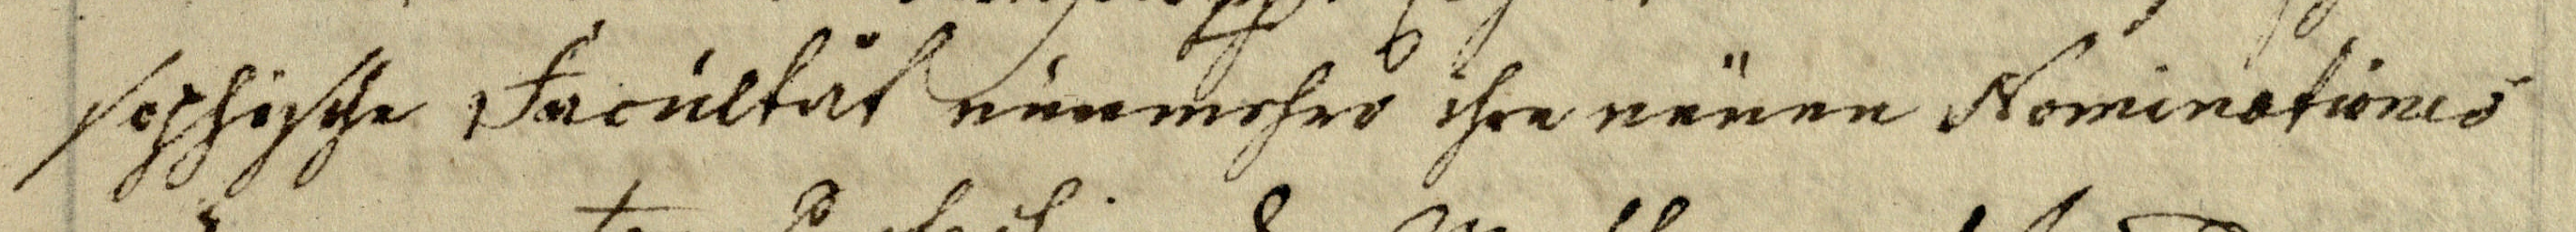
sophische Facultät nunmehro ihre neuen Nominationes
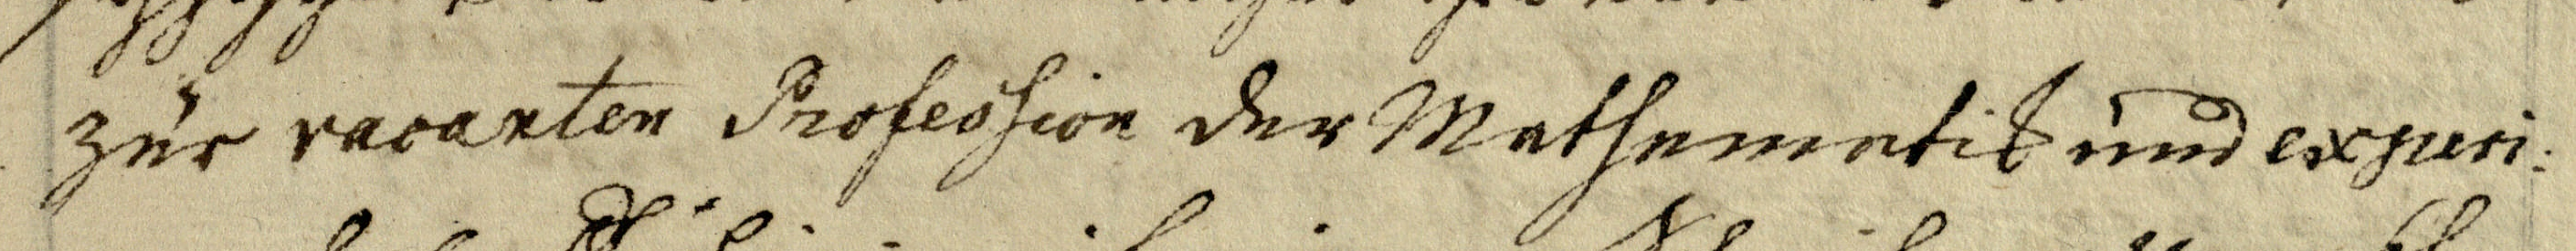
zur vacanten Profession der Mathematik und experi¬
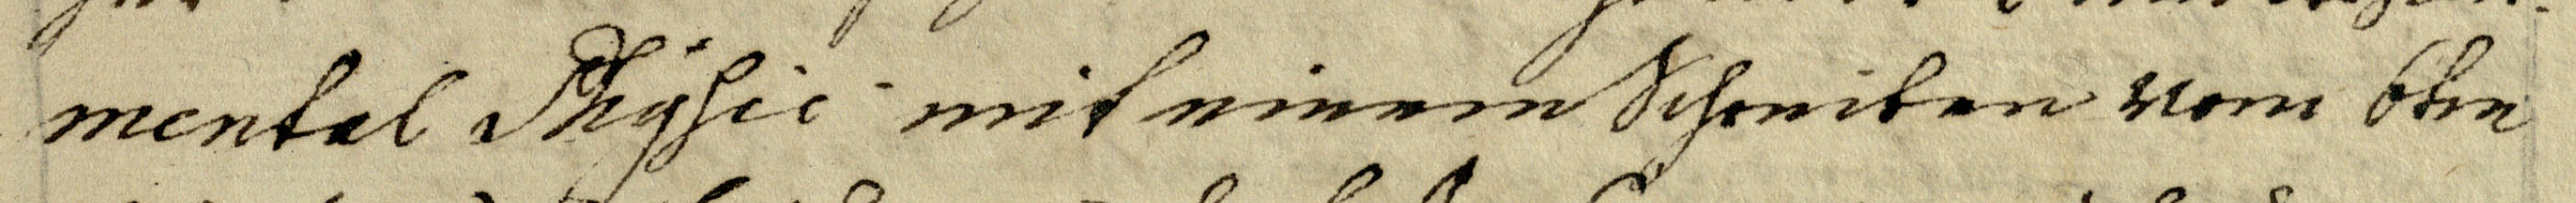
mental Phÿsic mit einem Schreiben vom 6 ten
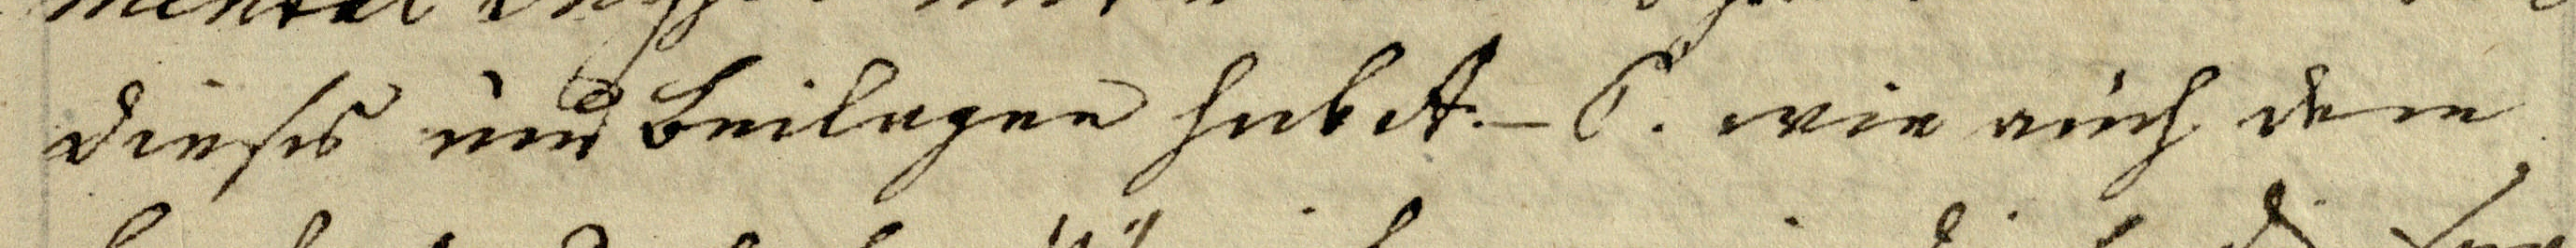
dieses und Beilagen sub A.-C. wie auch dem
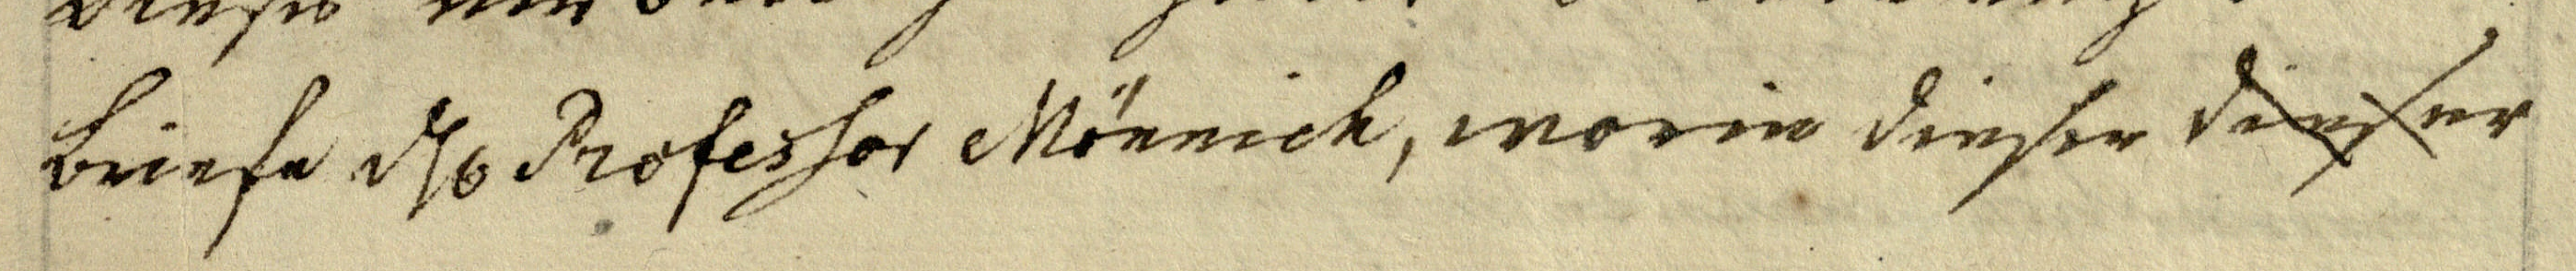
Briefe dh Professor Mönnich, worin dieser
